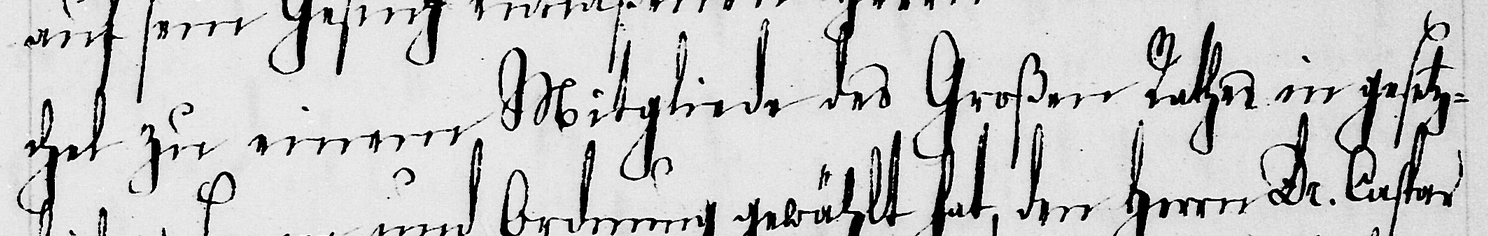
chel zu einem Mitgliede des Großen Rathes in gesetz¬
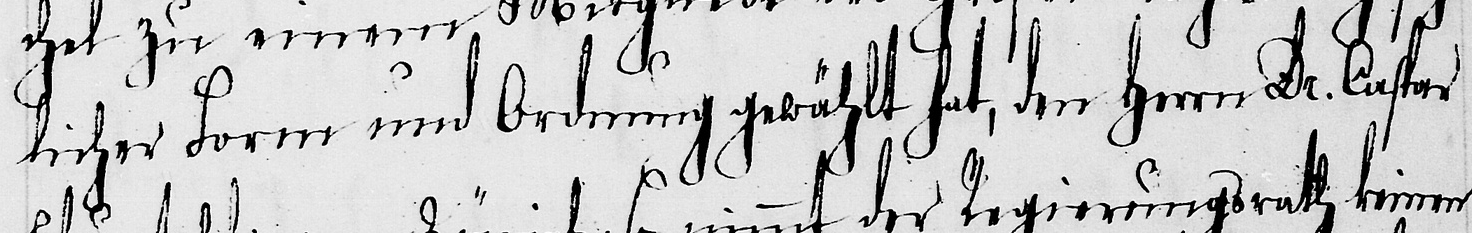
licher Form und Ordnung gewählt hat, den Herrn Dr.
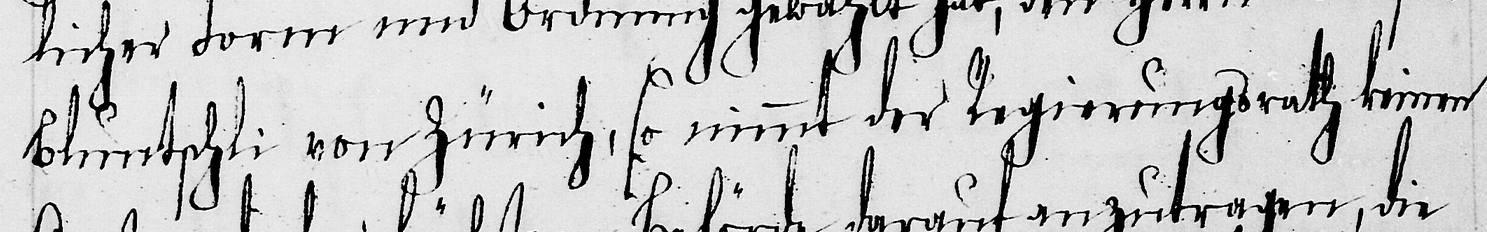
Bluntschli von Zürich, so nimmt der Regierungsrath keinen
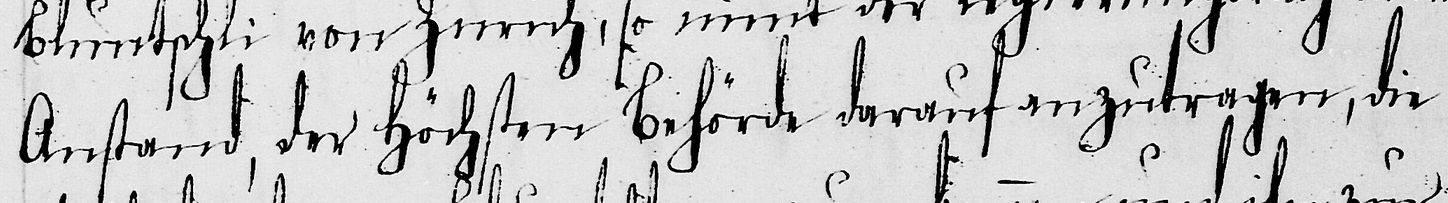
Anstand, der Höchsten Behörde darauf anzutragen, die
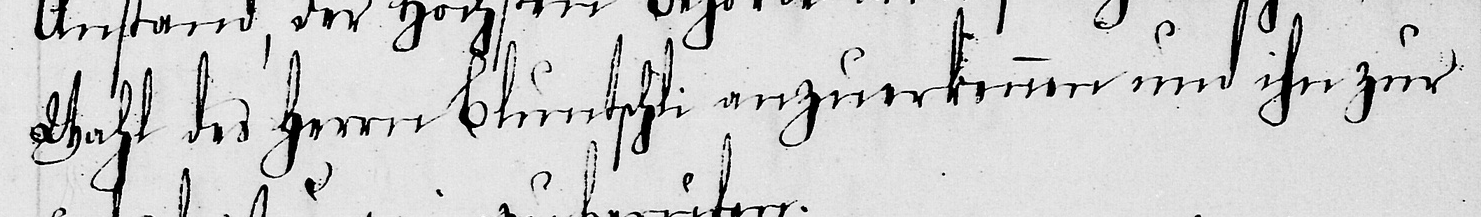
Wahl des Herrn Bluntschli anzuerkennen und ihn zur
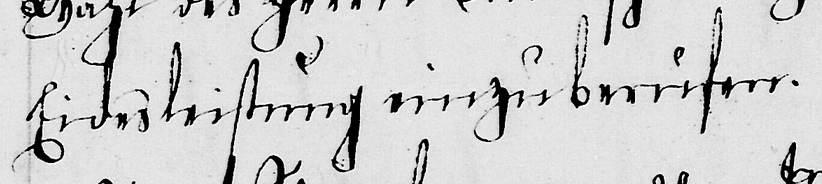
Eidesleistung einzuberufen.
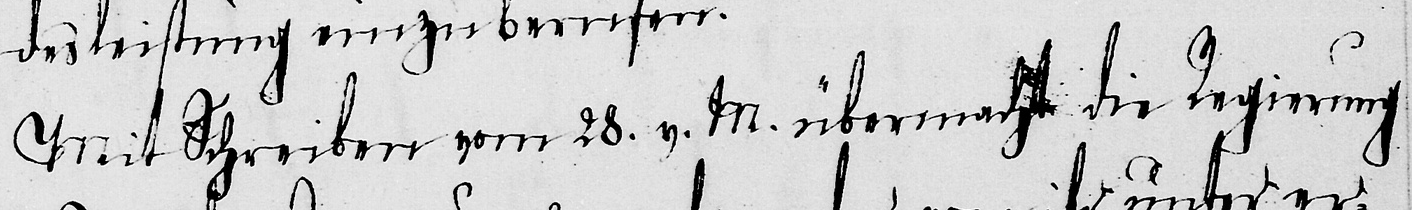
Mit Schreiben vom 28. v. M. übermacht die Regierung
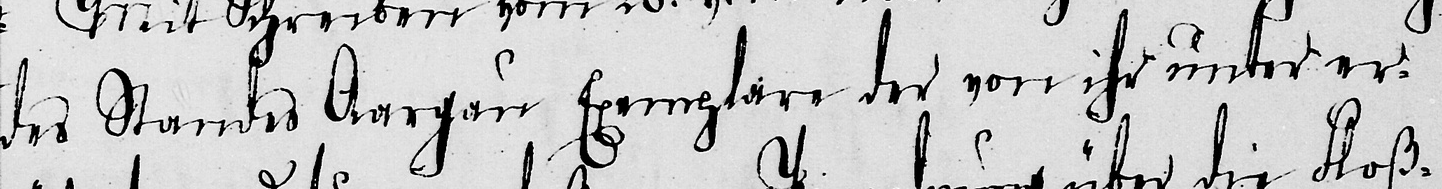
des Standes Aargau Exemplare der von ihr unter er¬
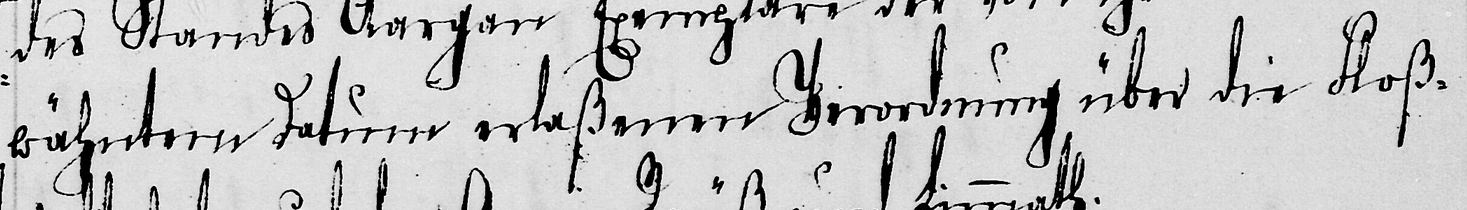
wähntem Datum erlaßenen Verordnung über die Floß¬
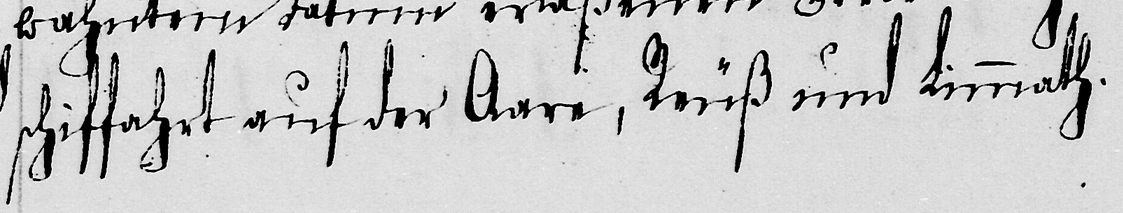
schiffahrt auf der Aare, Reuß und Limmath.
